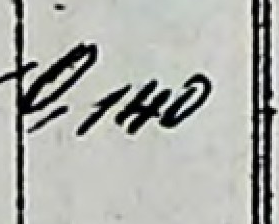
0,140
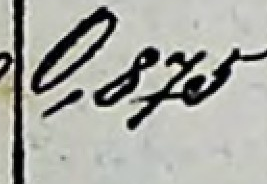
0,875
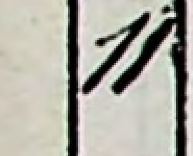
11
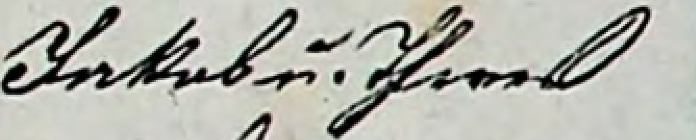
Jakob u. Theres
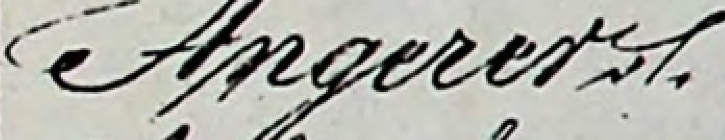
Angerer v.
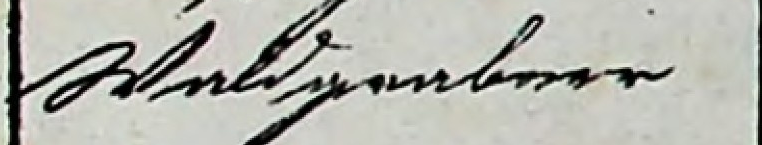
Waldgrabner
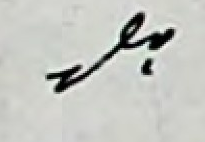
do
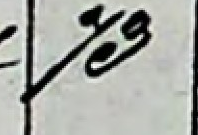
73
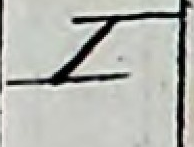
I
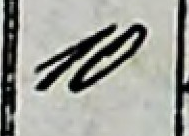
10
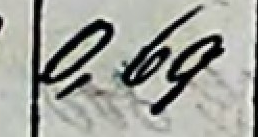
0,69
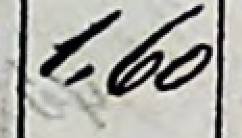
1,60
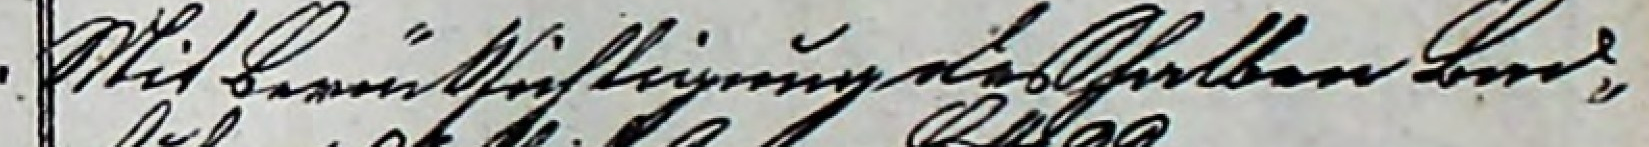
Mit Berücksichtigung Bad„
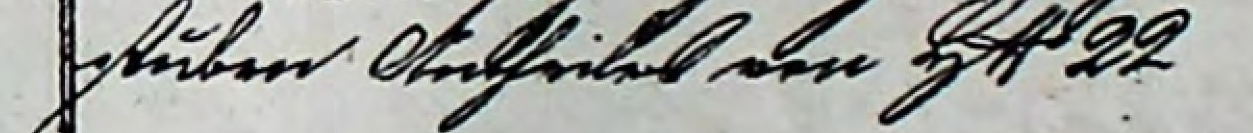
stuben Antheiles von Hn 22
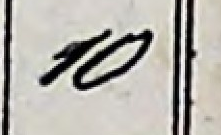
10
